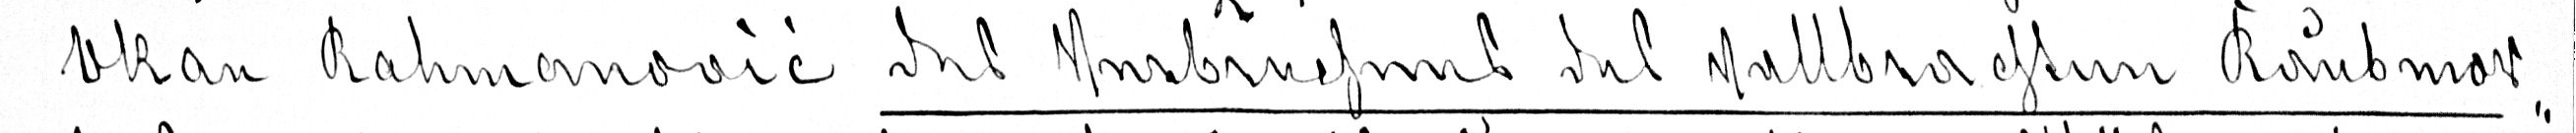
Okan Rahmanović des Verbrechens des vollbrachten Raubmor¬
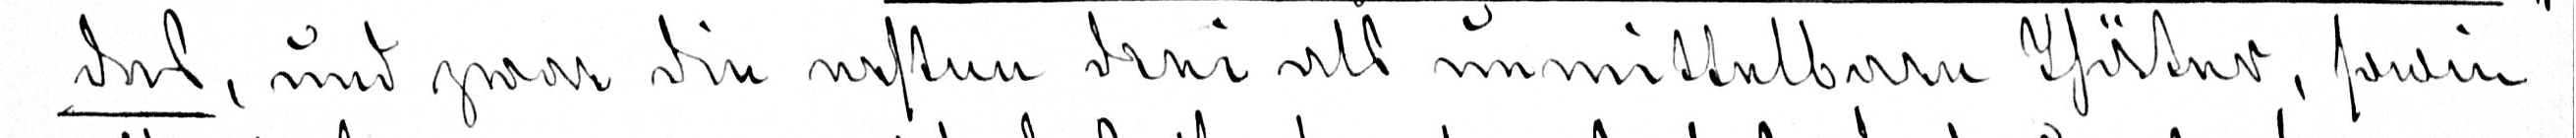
des, und zwar die ersten drei als unmittelbare Thäter, sowie
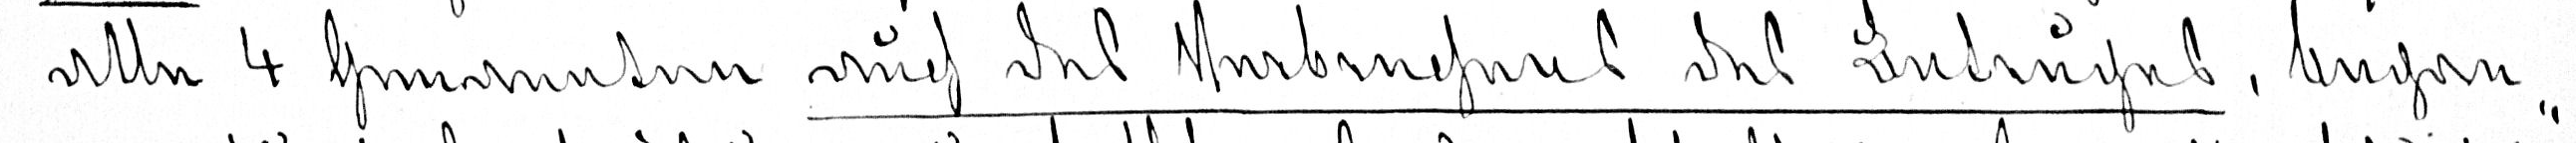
alle 4 Genannten auch des Verbrechens des Betruges, began¬
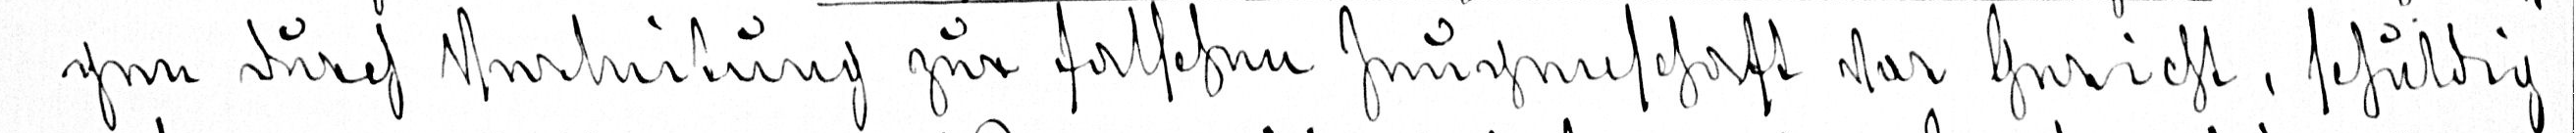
gen durch Verleitung zur falschen Jungenschaft vor Gericht, schuldig
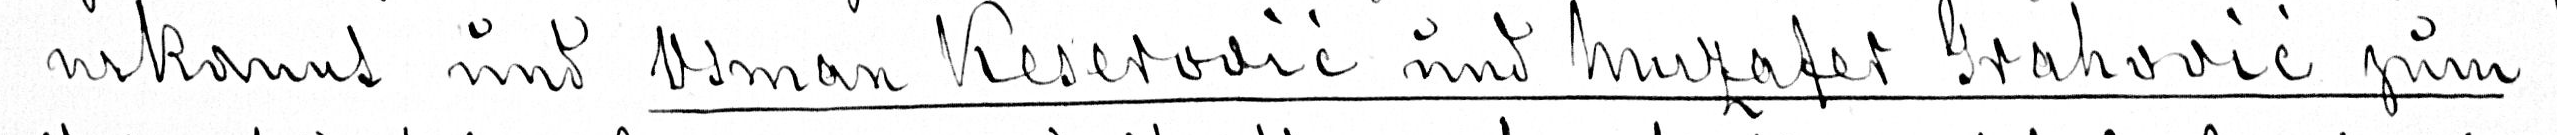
erkannt und Osman Keserović und Muzafer Grahović zum
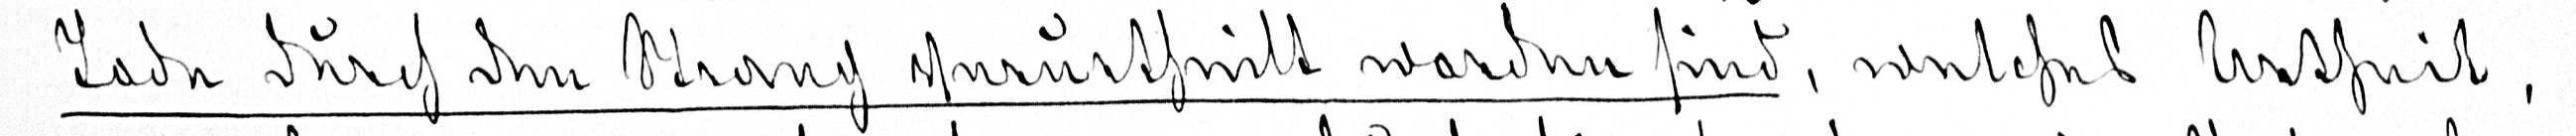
Tode durch den Strang verurtheilt worden sind, welches Urtheil,
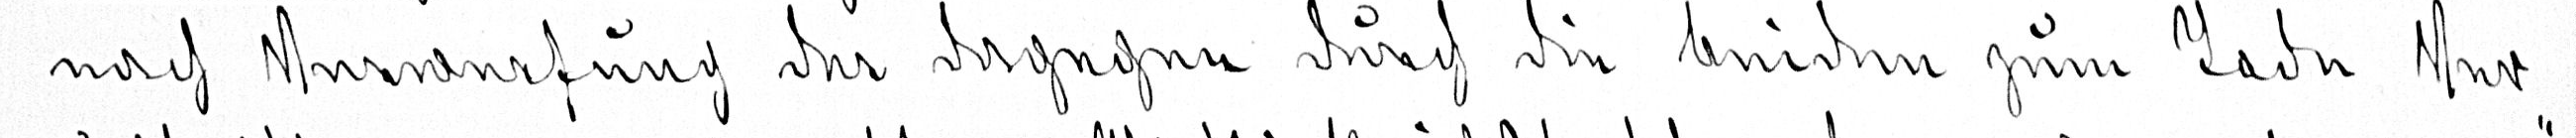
nach Verwerfung der dagegen durch die beiden zum Tode Ver¬
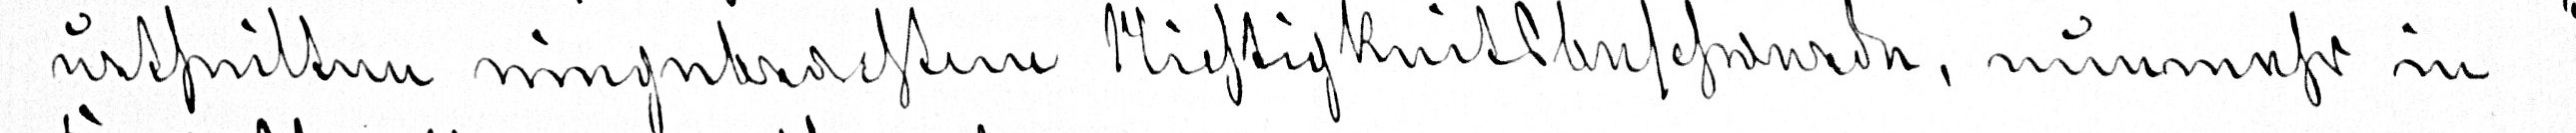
urtheilten eingebrachten Nichtigkeitsbeschwerde, nunmehr in
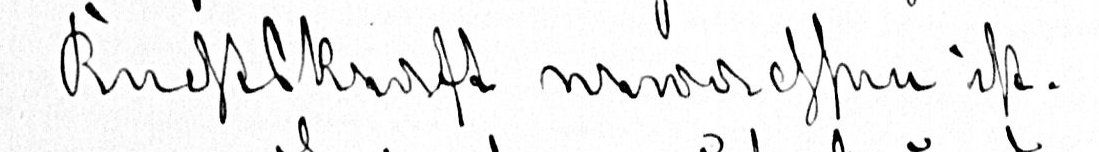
Rechtskraft erwachsen ist.
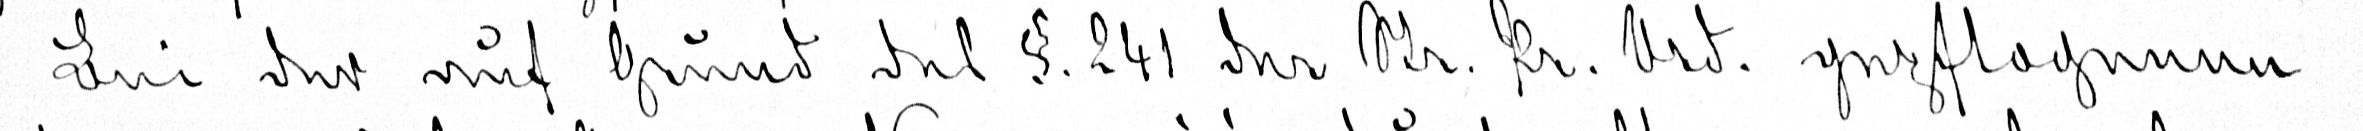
Bei der auf Grund des §. 241 der Str. Pr. Ord. gepflogenen
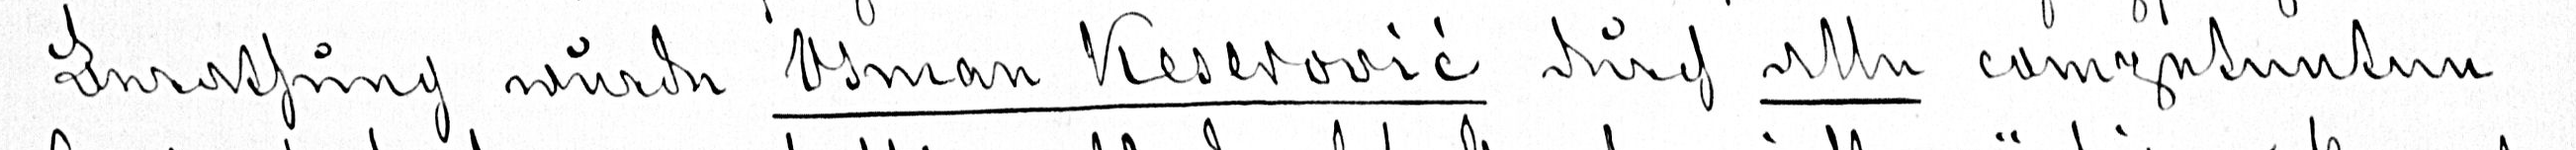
Berathung wurde Osman Keserović durch alle competenten
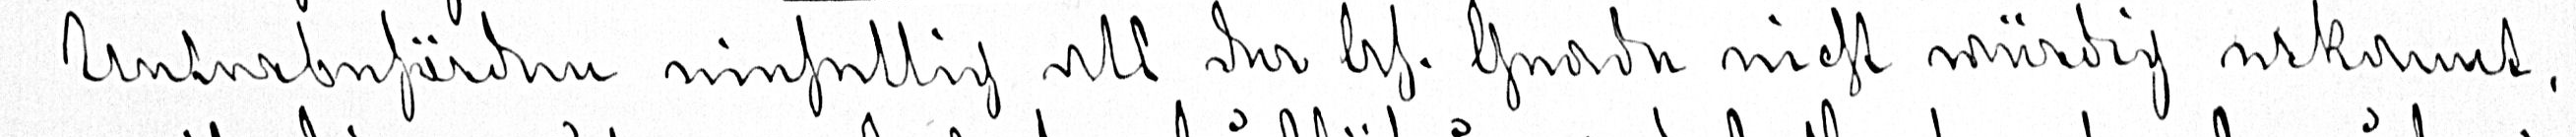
Unterbehörden einhellig als der Ah. Gnade nicht würdig erkannt,
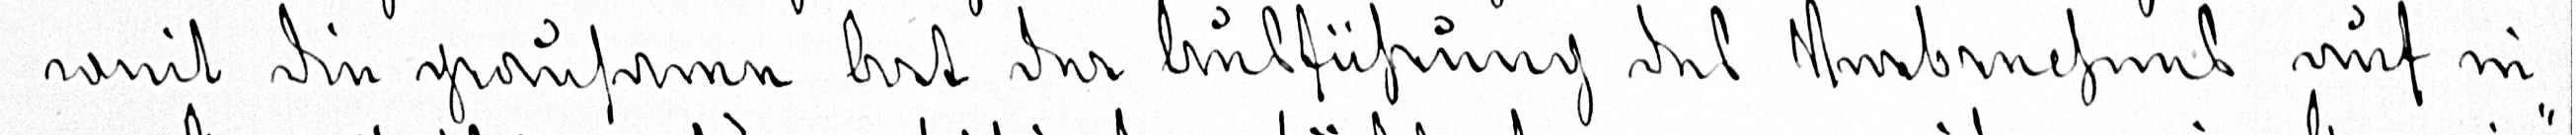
weil die grausame Art der Ausführung des Verbrechens auf ei¬
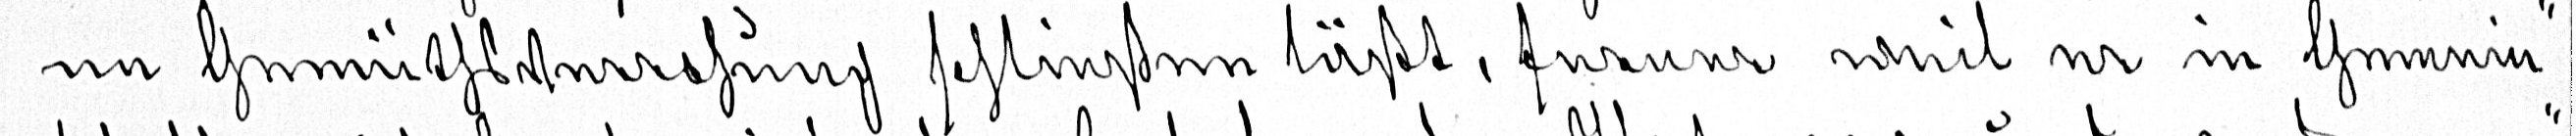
ne Gemüthsverrohung schließen läßt, ferner weil er in Gemein¬
